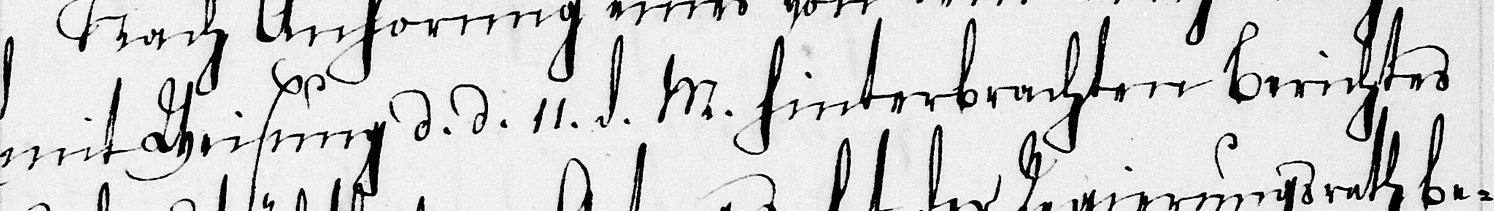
mit Weisung d. d. 11. d. M. hinterbrachten Berichtes
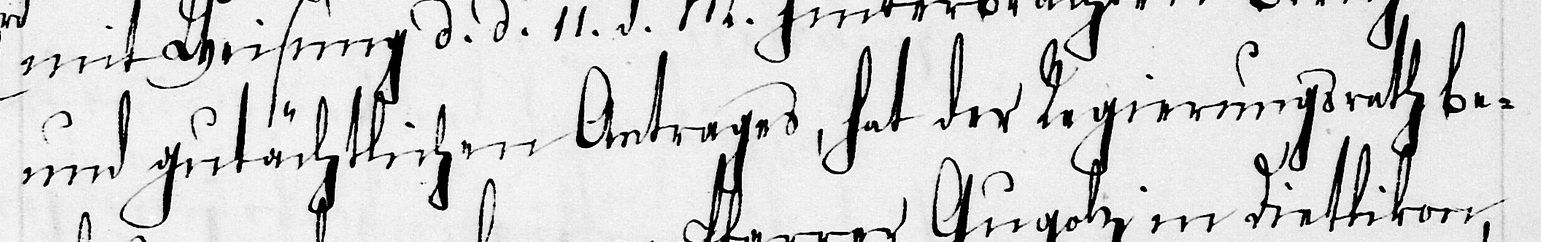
und gutächtlichen Antrages, hat der Regierungsrath be¬
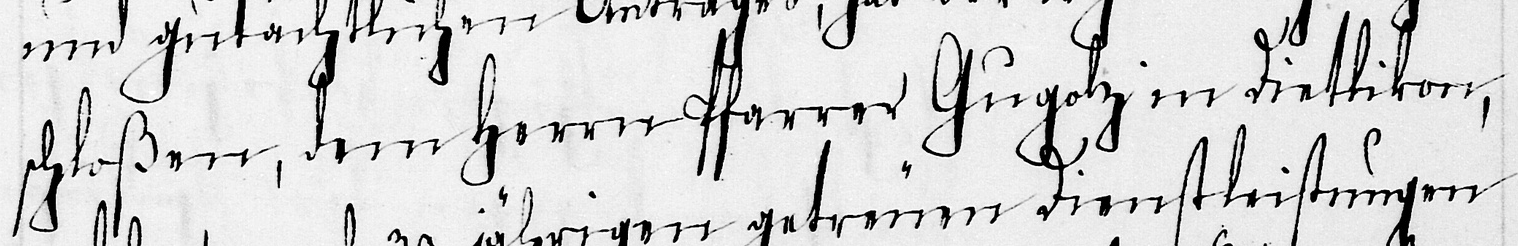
schloßen, dem Herrn Pfarrer Gugolz in Dietlikon,
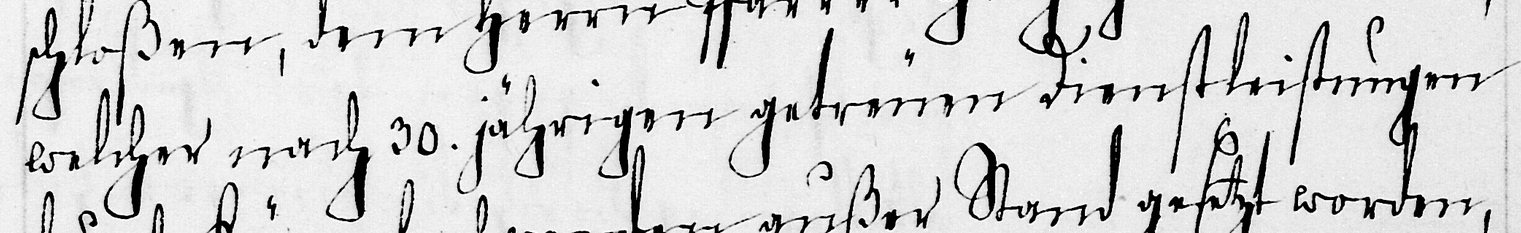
welcher nach 30. jährigen getreuen Dienstleistungen
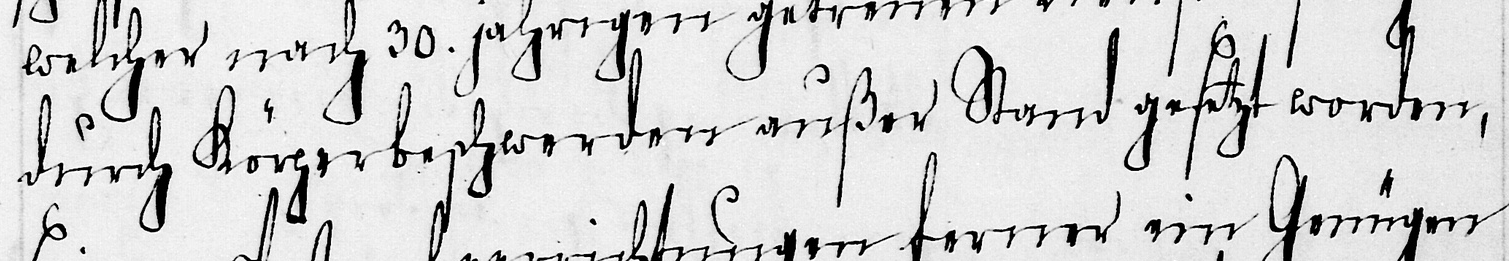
durch Körperbeschwerden außer Stand gesetzt worden,
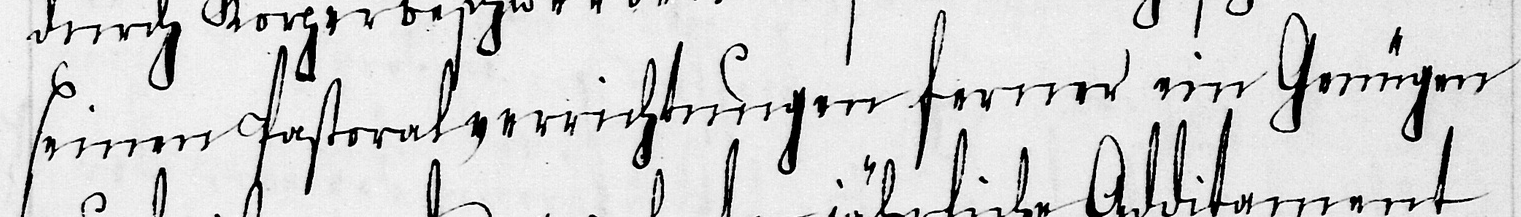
seinen Pastoralverrichtungen ferner ein Genügen
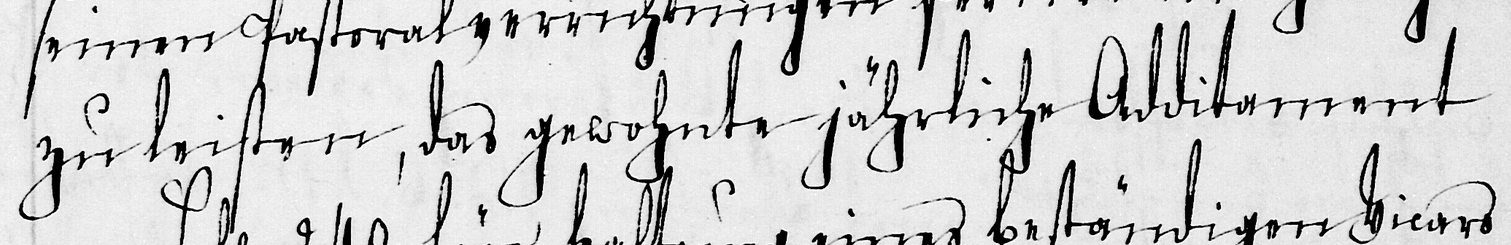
zu leisten, das gewohnte jährliche Additament
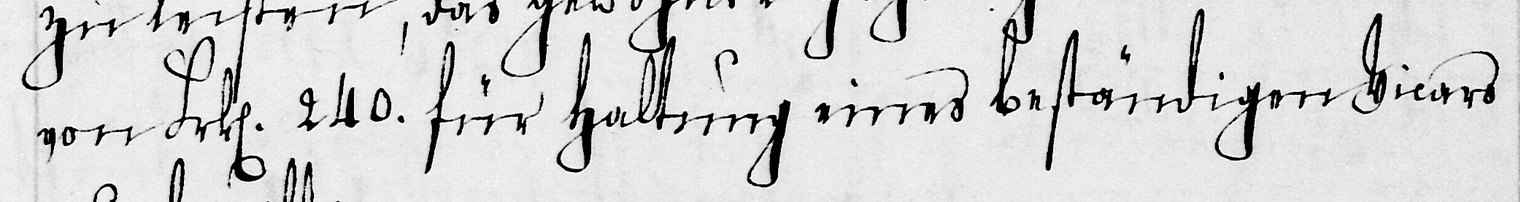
von Frk[en]. 240. für Haltung eines beständigen Vicars
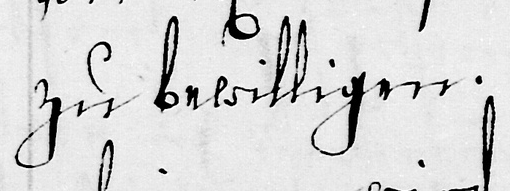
zu bewilligen.
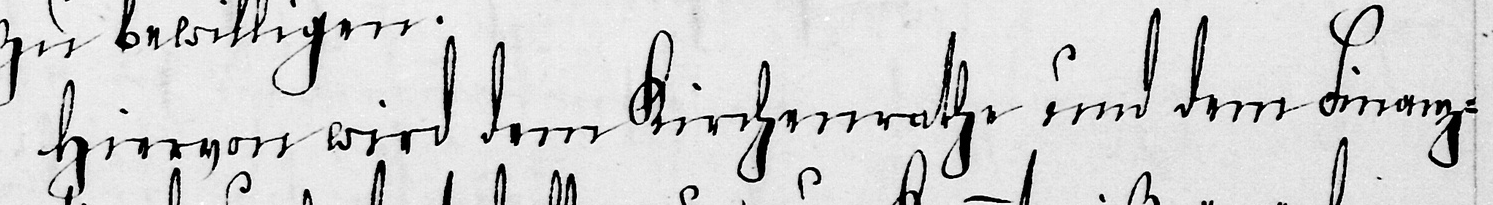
Hiervon wird dem Kirchenrathe und dem Finanz¬
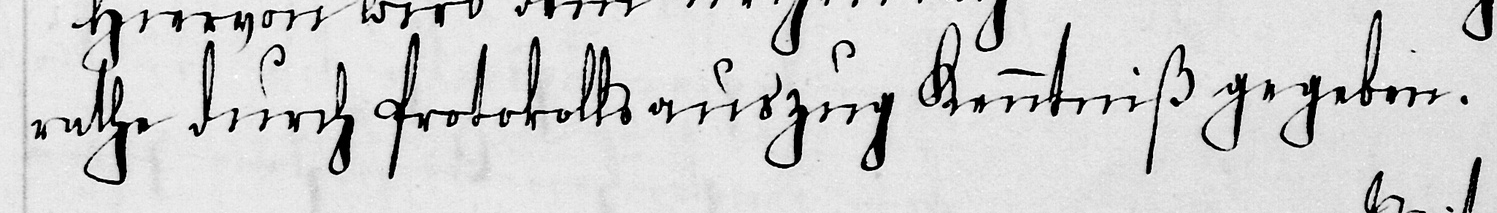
rathe durch Protokollsauszug Kenntniß gegeben.
